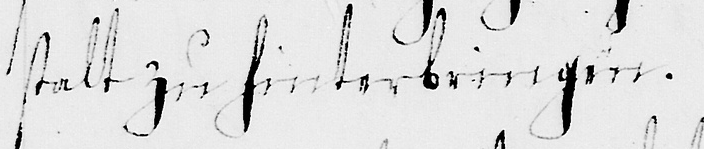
stalt zu hinterbringen.
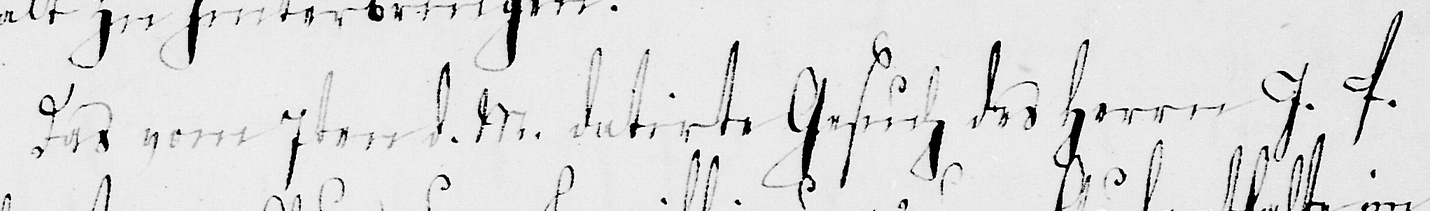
Das vom 7ten d. M. datirte Gesuch des Herrn J. P.
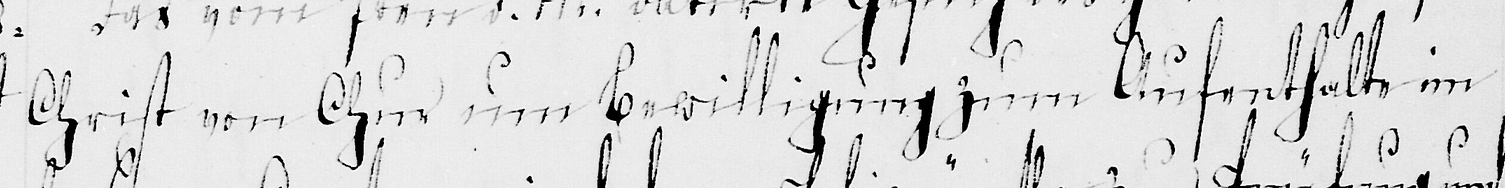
Christ von Chur um Bewilligung zum Aufenthalte im
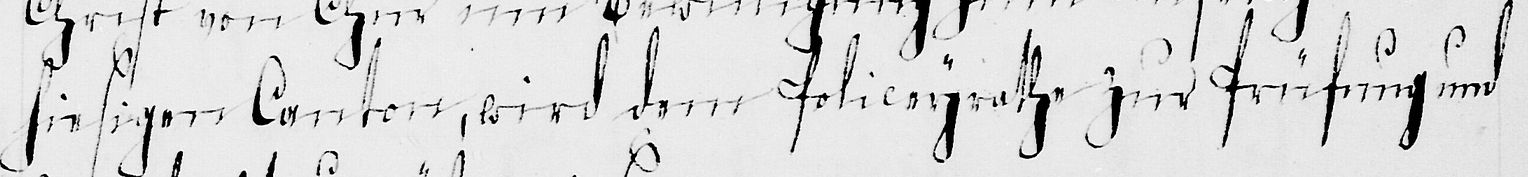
hiesigen Canton, wird dem Policeyrathe zur Prüfung und
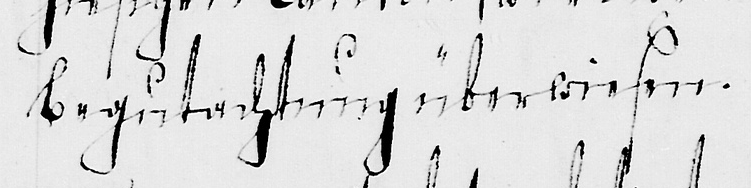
Begutachtung überwiesen.
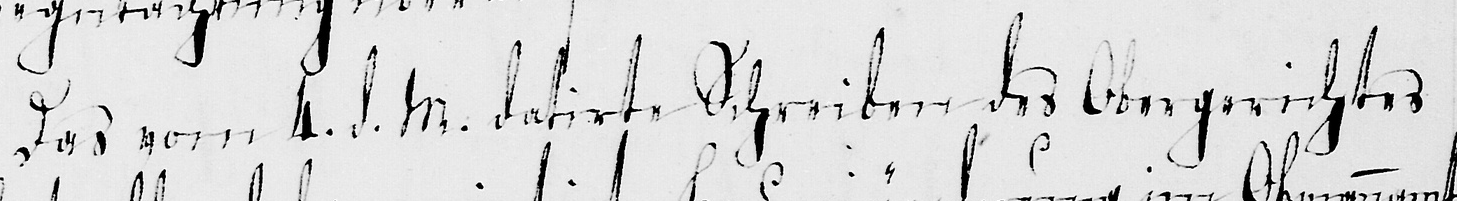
Das vom 4. d. M. datirte Schreiben des Obergerichtes
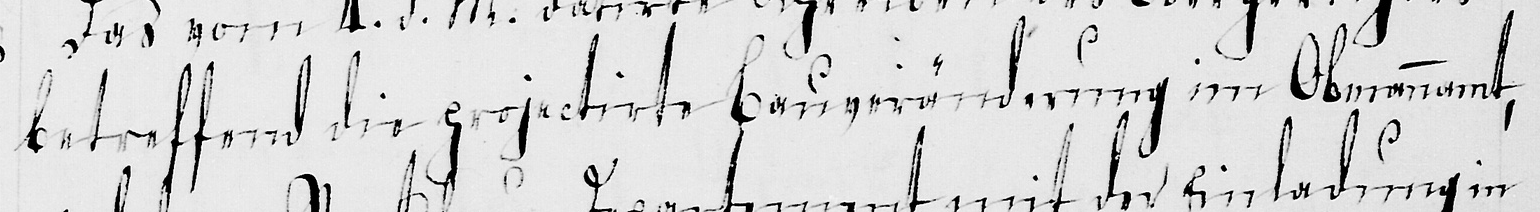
betreffend die projectirte Bauveränderung im Obmannamt,
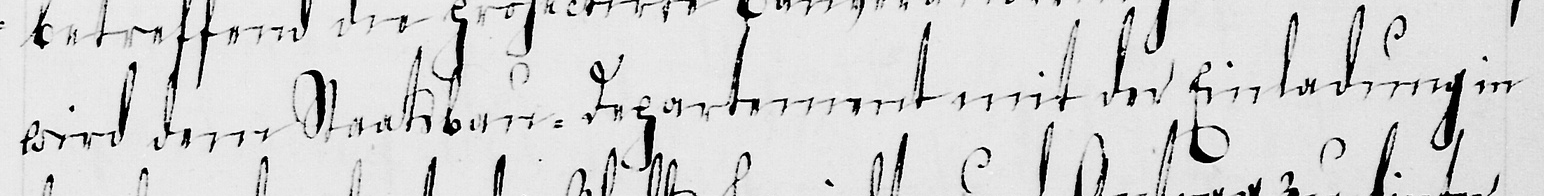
wird dem Staatsbau-Departement mit der Einladung in
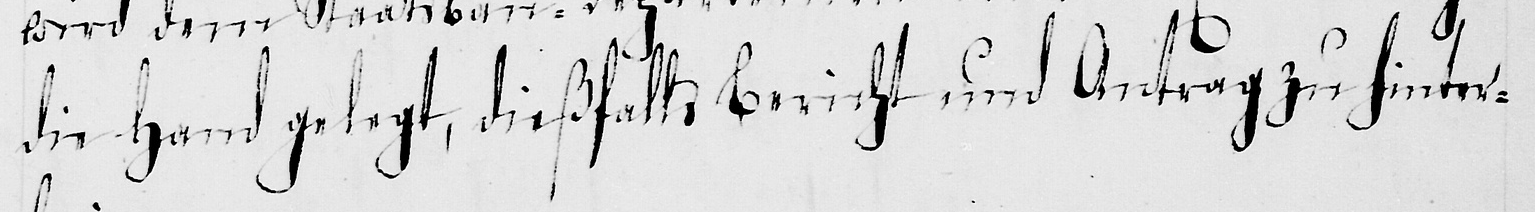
die Hand gelegt, dießfalls Bericht und Antrag zu hinter¬
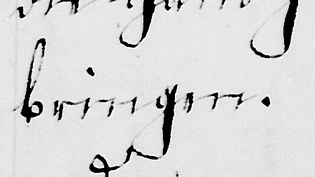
bringen.
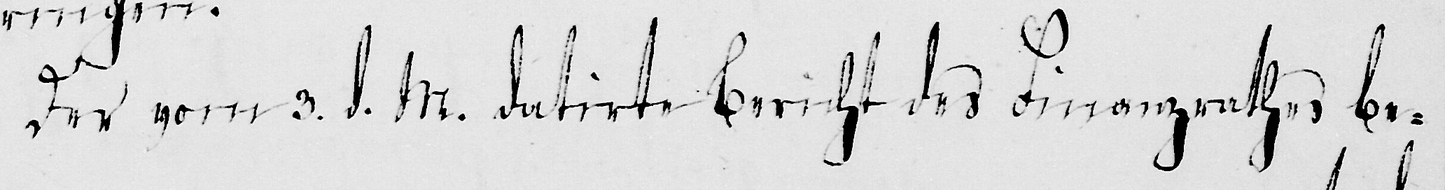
Der vom 3. d. M. datirte Bericht des Finanzrathes be-
